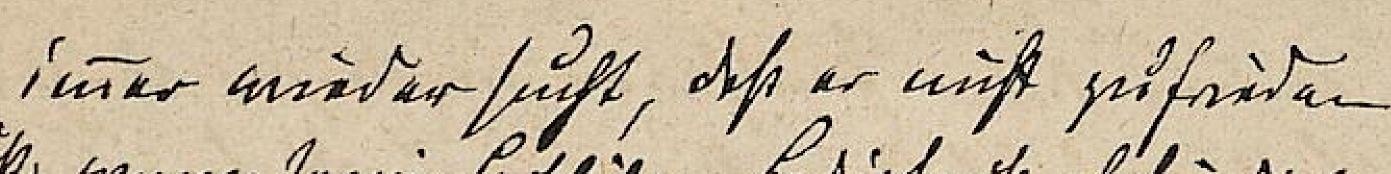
imer wieder sucht, daß er nicht zufrieden
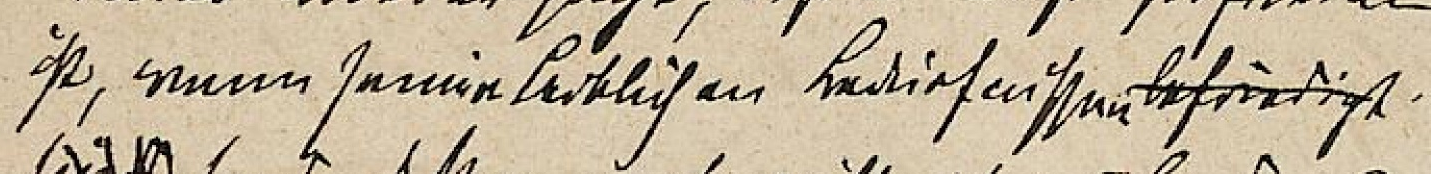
ist, wenn seine leiblichen Bedürfnissen befriedigt
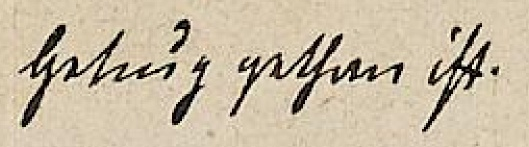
Gesug gethan ist
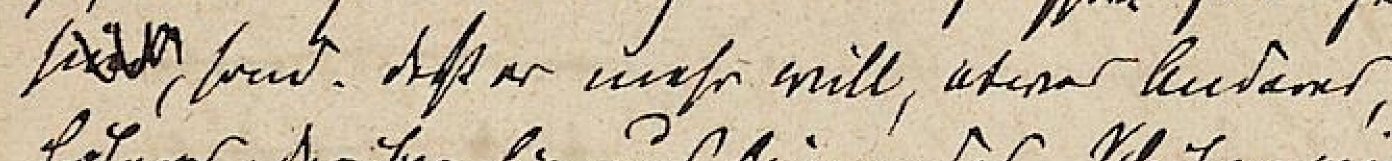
sind, sond. daß er mehr will, etwas Anderes,
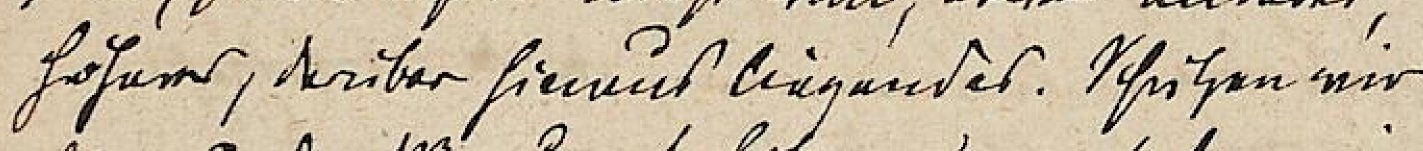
Höheres, darüber hinaus liegendes. Schätzen wir
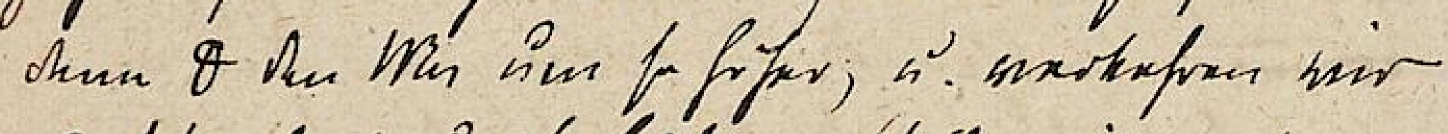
denn o den Mn um so höher, u. verkehren wir
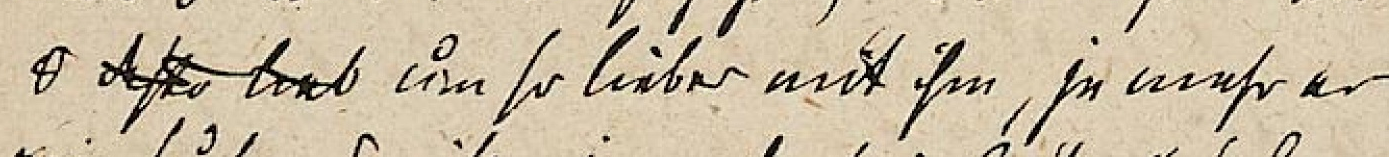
o desto lieb um so lieber mit ihm, je mehr er
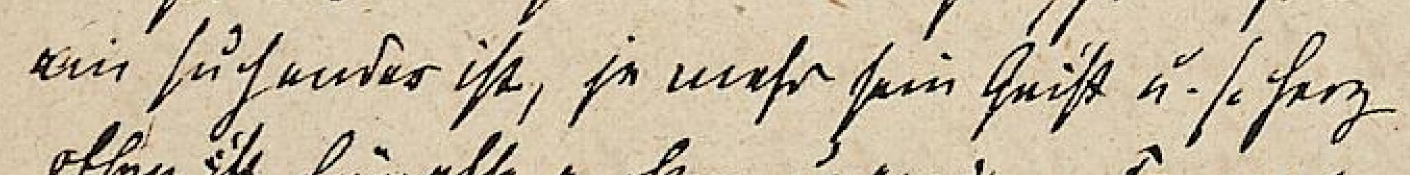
ein suchender ist, je mehr sein Geist u. s. Herz
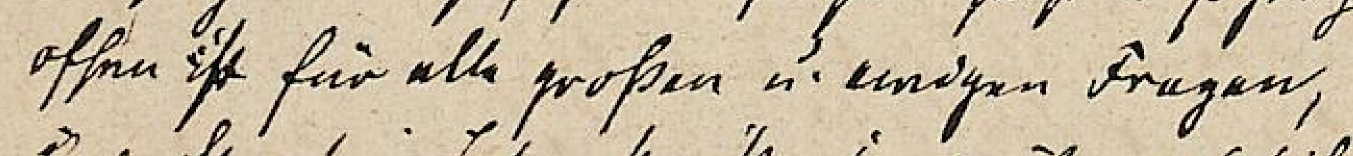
offen ist für alle großen u. ewigen Fragen
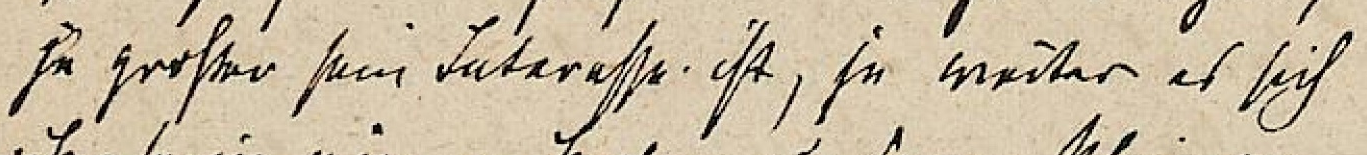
je größer sein Interesse. ist, je weiter es sich
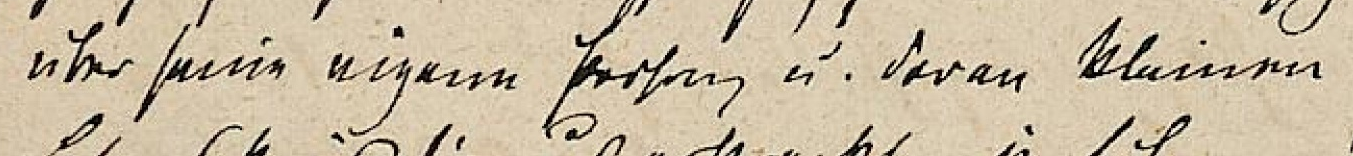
über seine eigene Person, u. deren kleinen
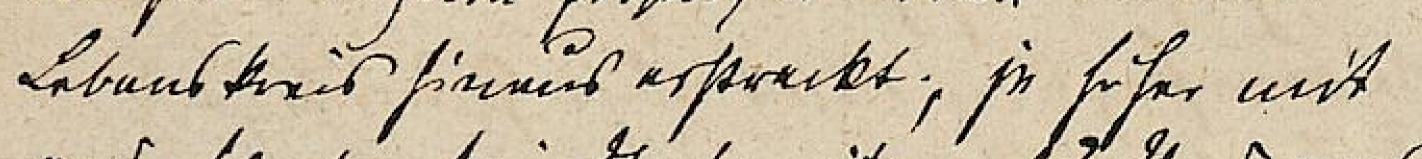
Lebenskreis hinaus erstreckt, je höher mit
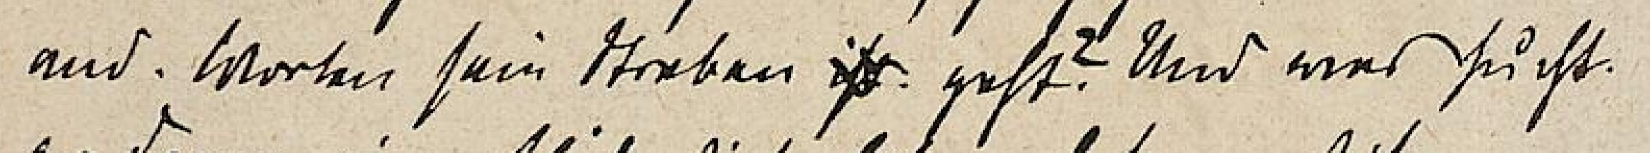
and. Worten sein Streben ist geht? Und was sucht.
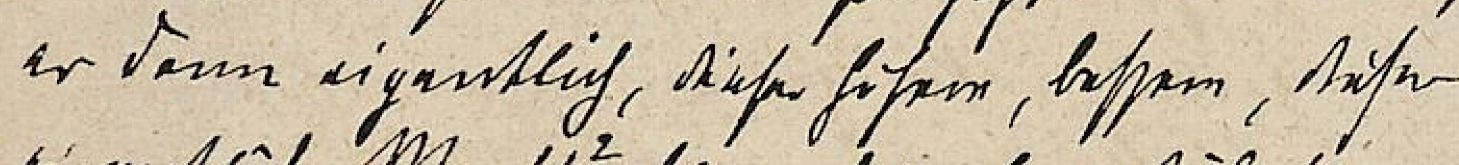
er denn eigentlich, dieser höhere, bessere, dieser
